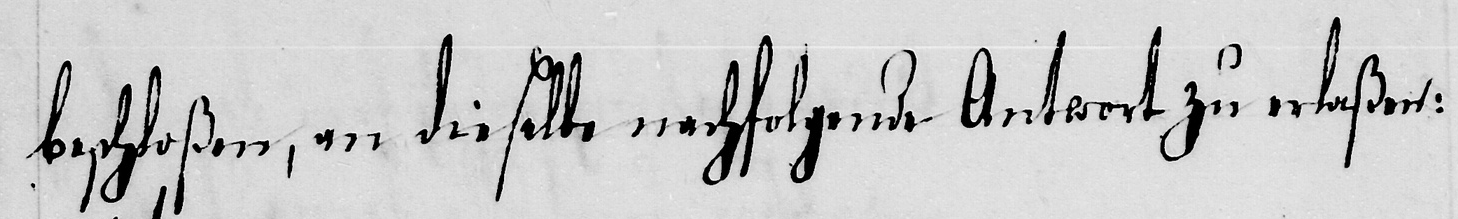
beschloßen, an dieselbe nachfolgende Antwort zu erlaßen:
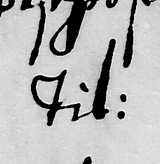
igt
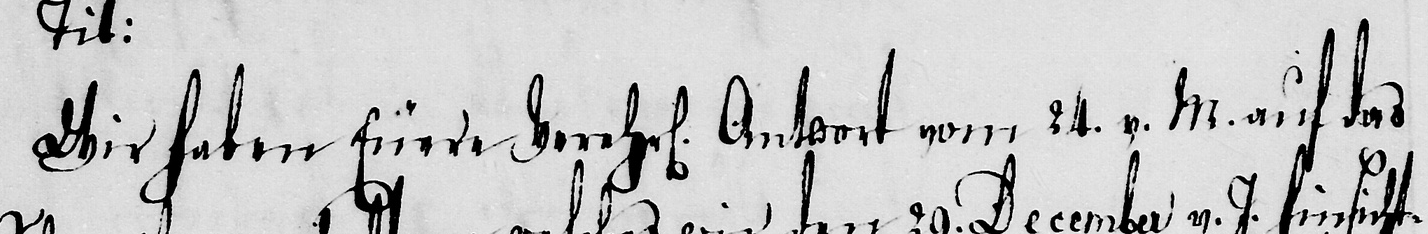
Wir haben Euere Verehrl. Antwort vom 24. v. M. auf das
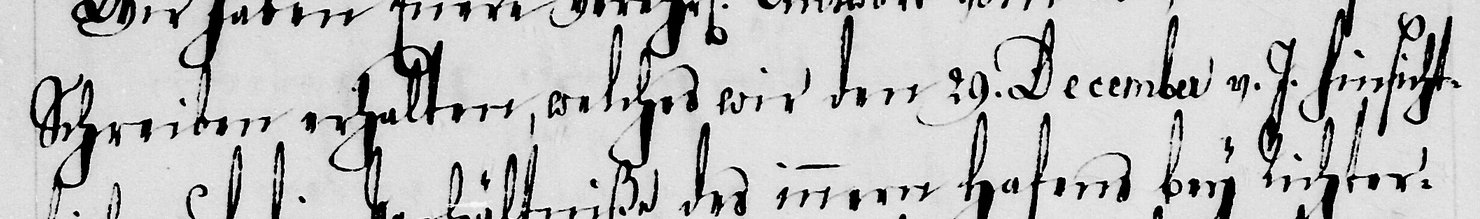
Schreiben erhalten, welches wir den 29. December v. J. hinsich¬
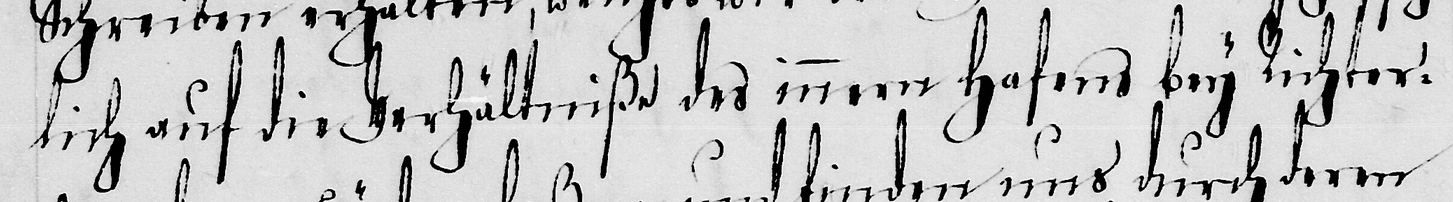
tlich auf die Verhältniße des innern Hafens bey Richter¬
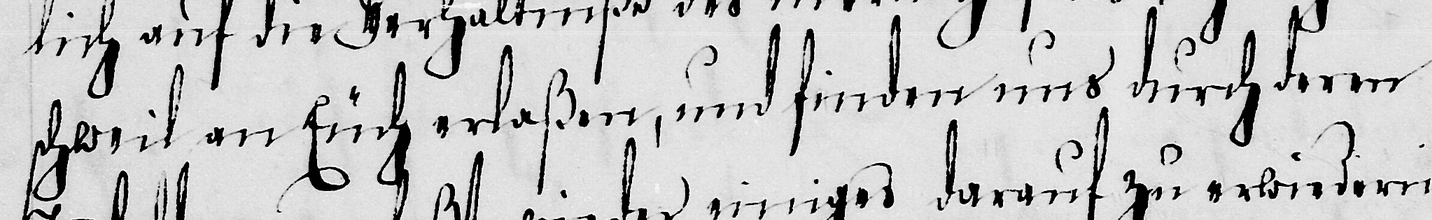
schweil an Euch erlaßen, und finden uns durch deren
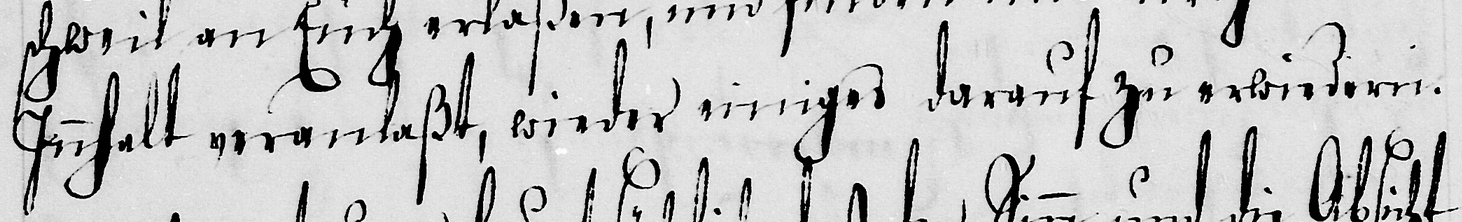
Innhalt veranlaßt, wieder eines darauf zu erwiedern.
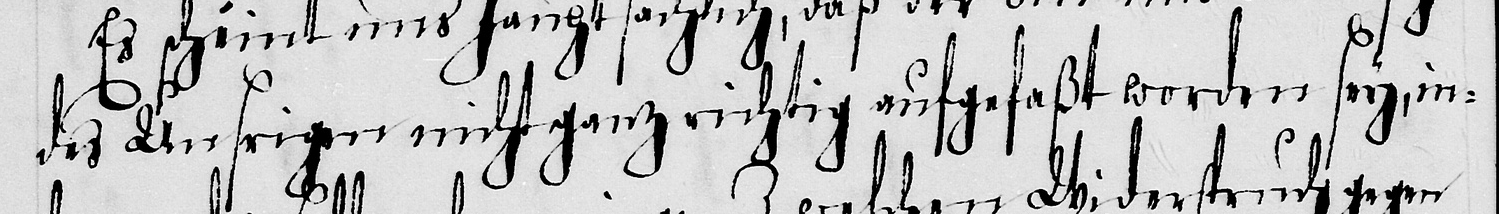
des Unsrigen nicht ganz richtig aufgefaßt worden sey, in¬
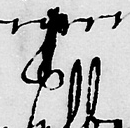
Ab¬
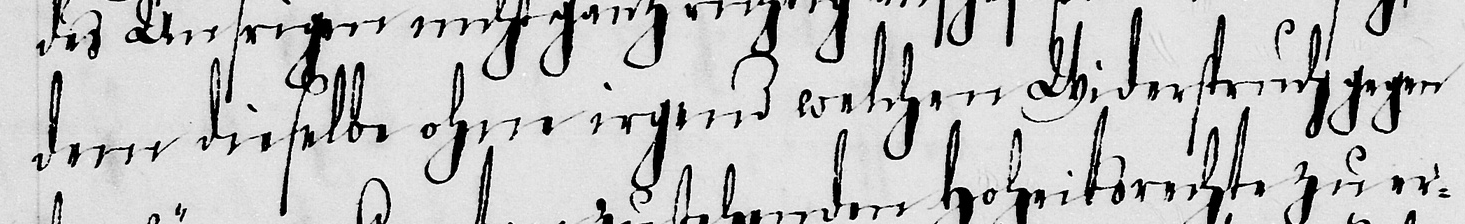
dem dieselbe ohne irgend welchen Widerspruch gegen
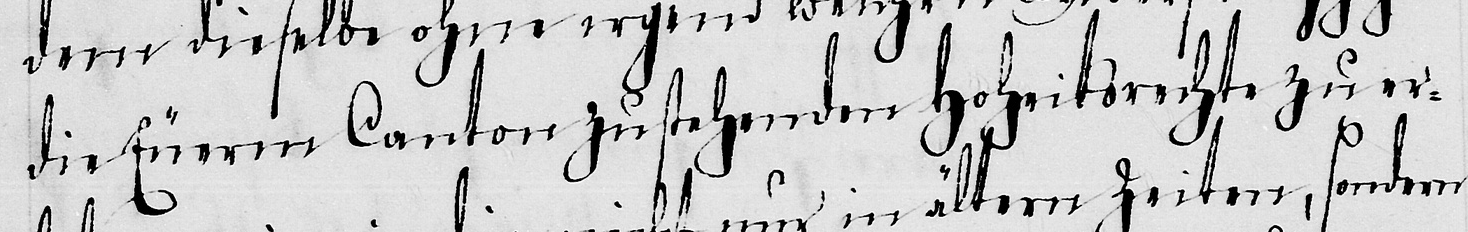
die Euerm Canton zustehenden Hoheitsrechte zu er¬
